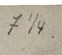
Zürich
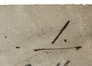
7 Dezr
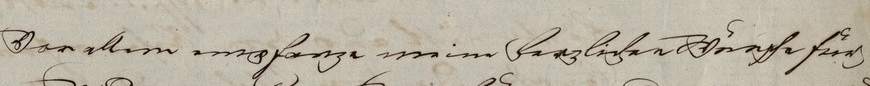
Vor allem empfange meine herzlichen Wünsche für
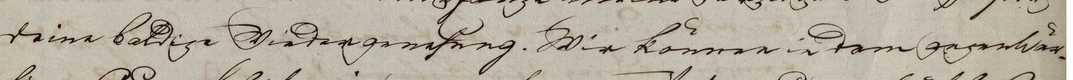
deine baldige Wiedergenesung. Wir können in dem gegenwär-
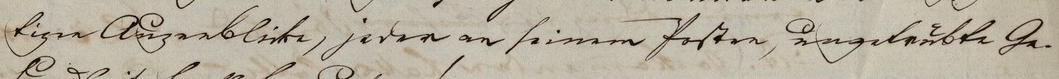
tigen Augenblicke, jeder an seinem Posten, ungetrübte Ge-
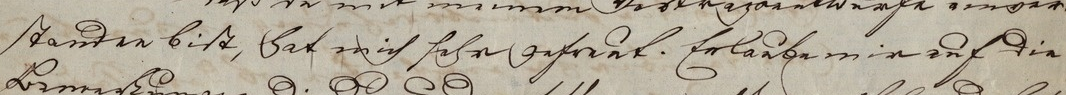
standen bist, hat mich sehr gefreut. Erlaube mir auf die
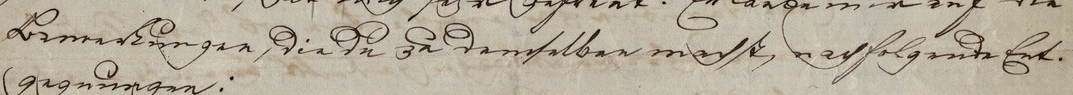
Bemerkungen, die Du zu demselben machst, nachfolgende Ent-
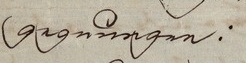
gegnungen:
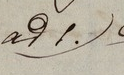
ad 1.)
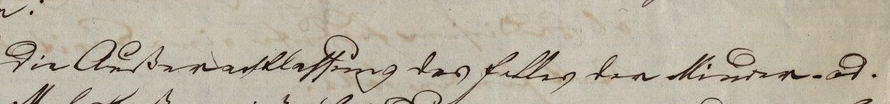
Die Außerachtlassung des Falles der Minder- od.
